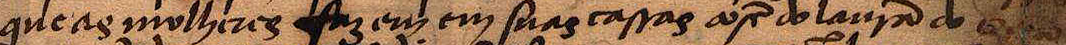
que as molheres fazem em suas cassas cosēdo laurādo e fiā
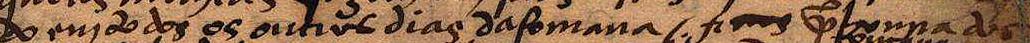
do em todos os outros dias da somana /. e _ p̄o honrra dos
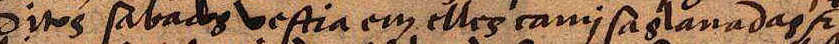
ditos sabados vestia em elles camjsas lauadas e
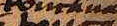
toucaua
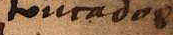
toucados
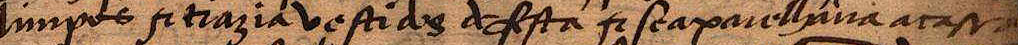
limpos e trazia vestidos de festa e se aparelhaua a cassa
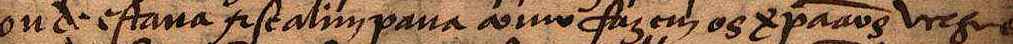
onde estaua e se alimpaua como fazem os xpaãos velhos
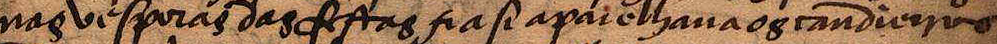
nas vesporas das festas e asi aparelhaua os candieiros
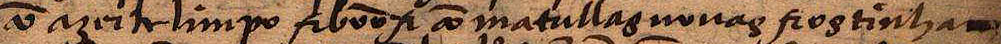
c̄o azeite limpo e bōo e c̄o matullas nouas e os tinha _
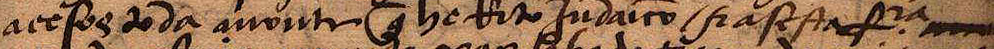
acesos toda a noute q̄ he Rito Judaico / e a sesta f.ra __
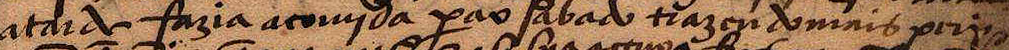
a tarde fazia a comjda ꝑa o sabado trazendo mais peixe
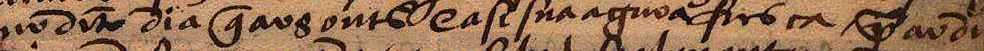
no dito dia q̄ aos outso e asi sua aguoa fresca / p̄o ao di
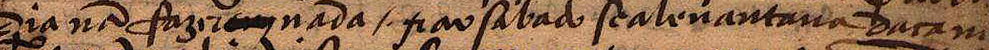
dia nā fazerem nada /. e ao sabado se aleuantaua da cam
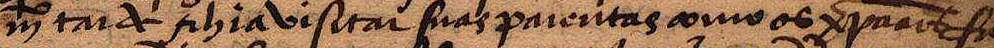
mto tarde e hia visitar suas parentas como os xpaãos fa
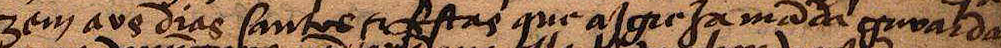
zem aos dias santos e festas que a JgreJa māda guoarda
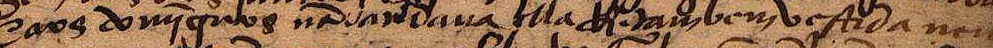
e aos domj̄guos nā andaua ella Re tam bem vestida nem
